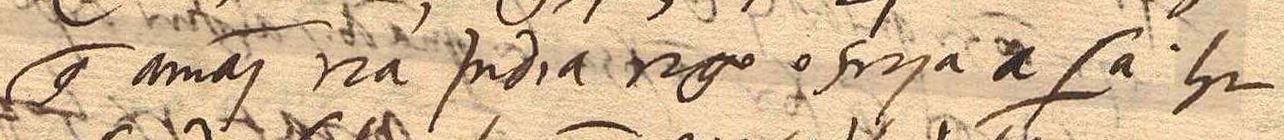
q̄ a mãj era Judia ergo o serja a fa he
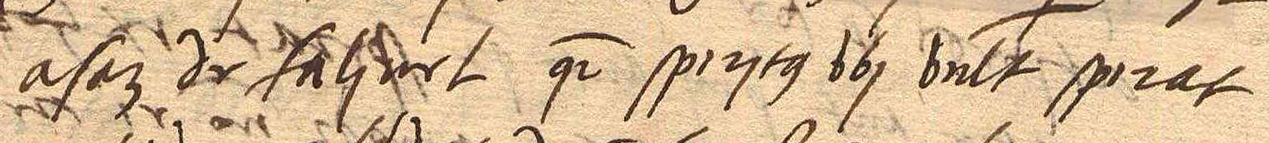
asaz de faljuel q̄r spirjtꝯ vbj vult spirat
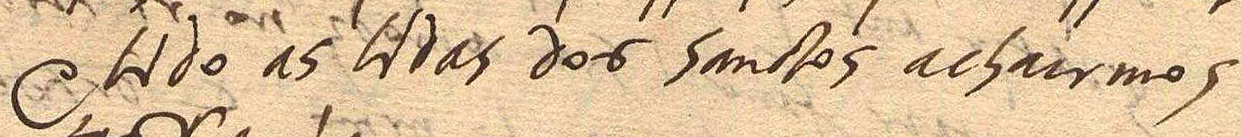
e lēdo as lēdas dos sanctos achamos
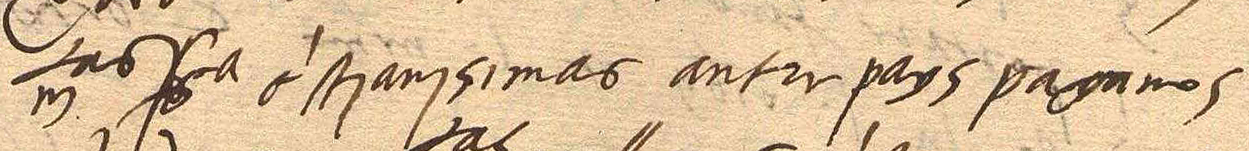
mtas fsa cistjanjsimas antre pays paganos
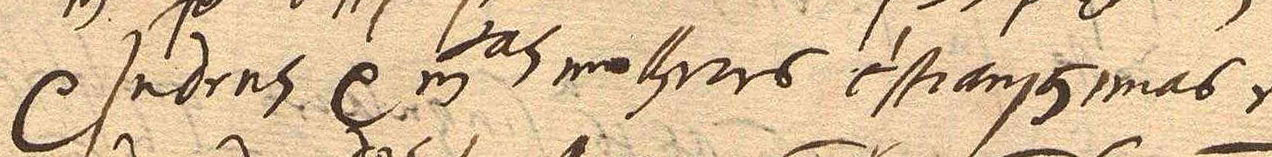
e Judeus e mtas molheres cistianjsimas ē
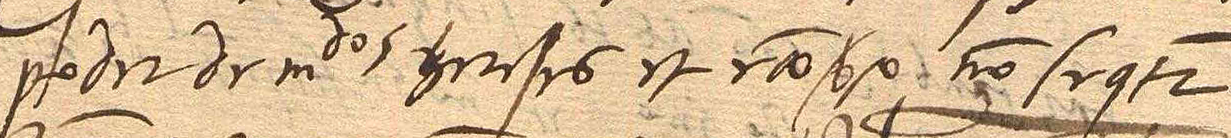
poder de mdos hereJes et ec̄oꝟso nō seqtr̄
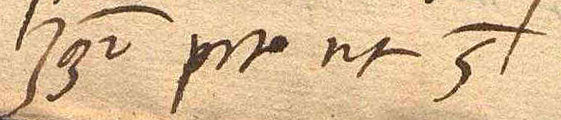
Jgr̄ peto ut s̄
